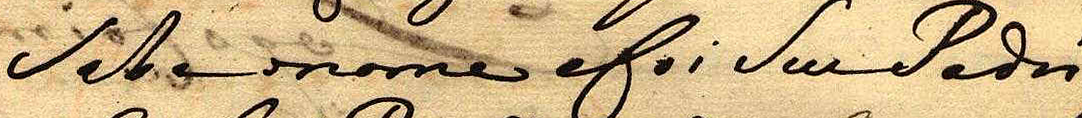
Sabe o nome e foi Seu Padri
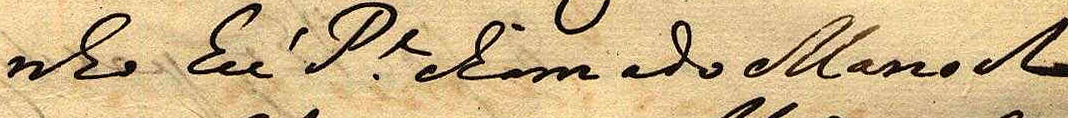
nho hū P.e chamado Manoel
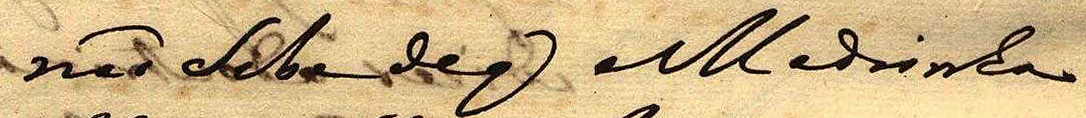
naõ Sabe de q̄ e Madrinha
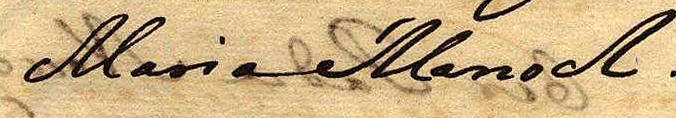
Maria Manoel.
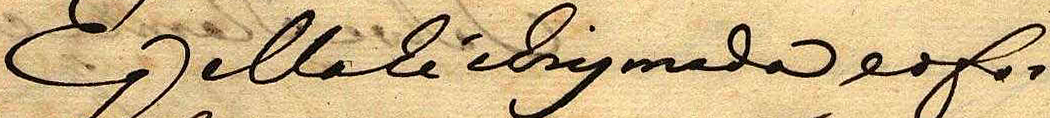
E q̄ ella hé chrismada, e o foi
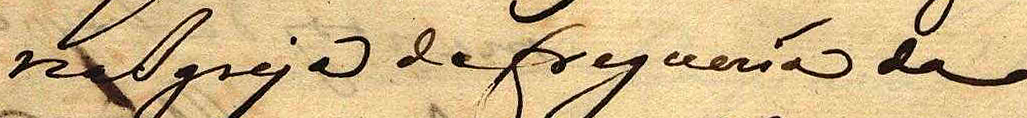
na Igreja de freguezia da
